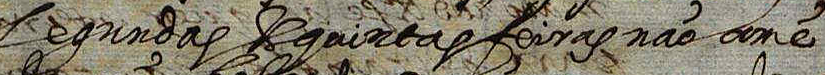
segundas & quintas feiras naõ comē
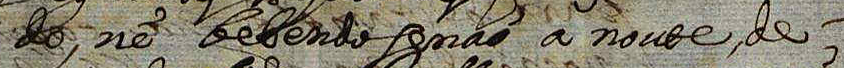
do, ne̅ bebendo senaõ a noute, de
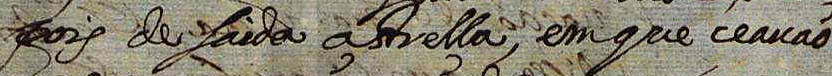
pois de saida a strella, em que ceauaõ
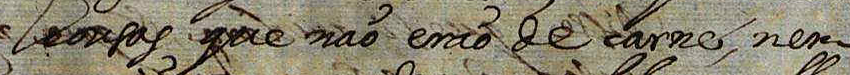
cousas que naõ eraõ de carne, nem
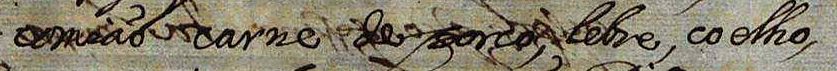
comiaõ carne de porco, lebre, coelho,
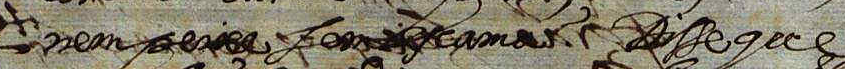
nem peixe sem escama? Disse que
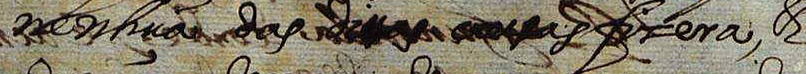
nenhuã das dittas cousas fizera, &
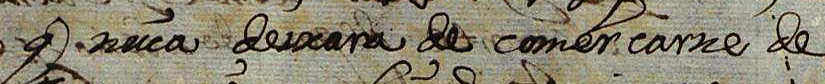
q̄ nūca deixara de comer carne de
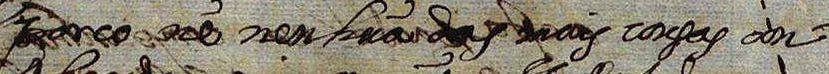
porco nē nenhuã das mais cousas con
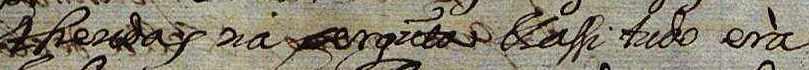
theudas na pergūta & assi tudo era
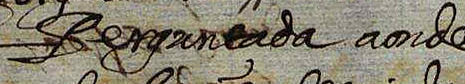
Perguntada aonde
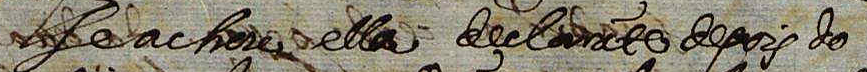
se achou ella declarāte depois do
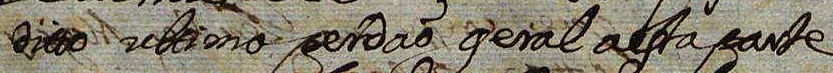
ditto ultimo perdaõ geral a esta parte
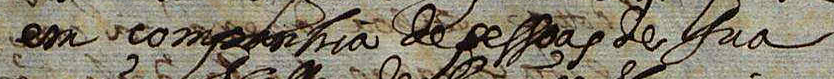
em companhia de pessoas de sua
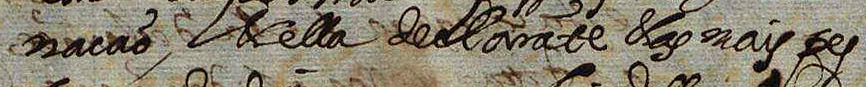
naçaõ, nella declarāte & as mais pes
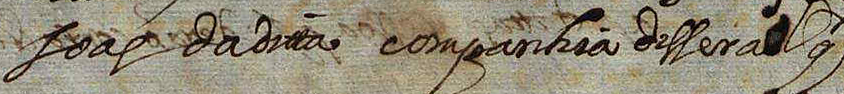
soas da ditta companhia disseraõ q̄
